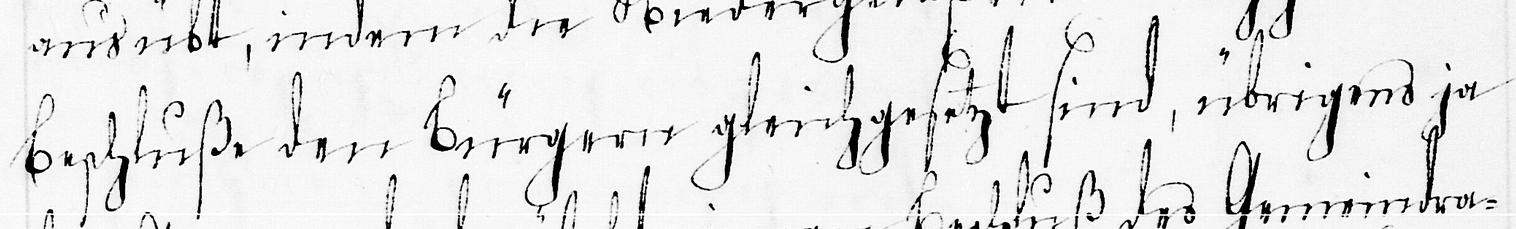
Beschluße den Bürgern gleichgesetzt sind, übrigens ja
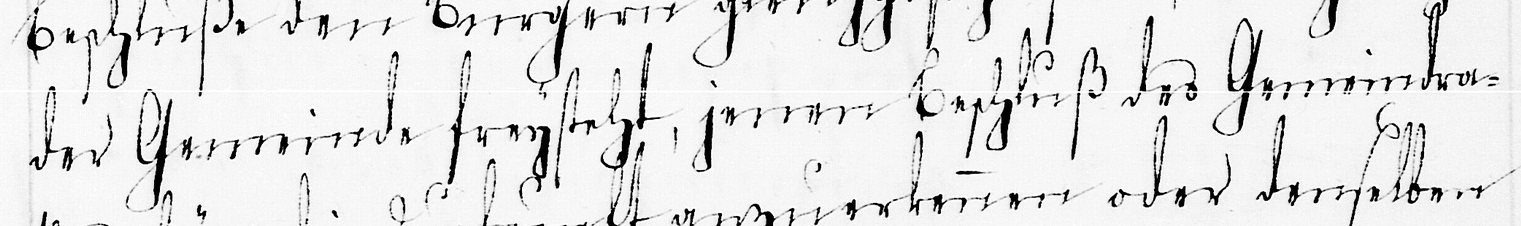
der Gemeinde freysteht, jenen Beschluß des Gemeindra¬
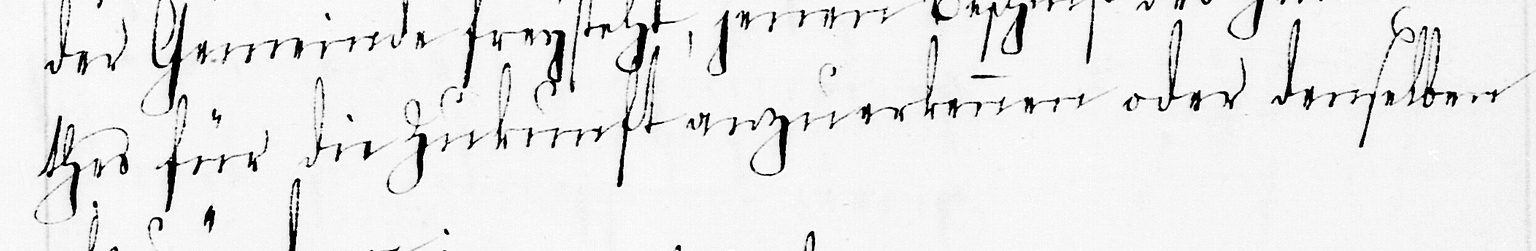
thes für die Zukunft anzuerkennen oder denselben
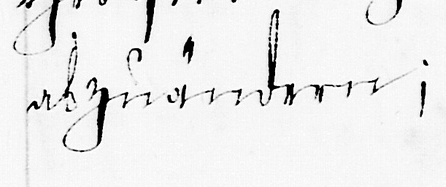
abzuändern;
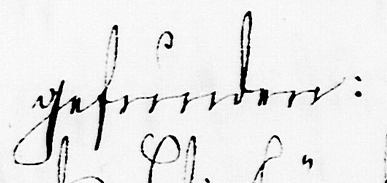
gefunden:
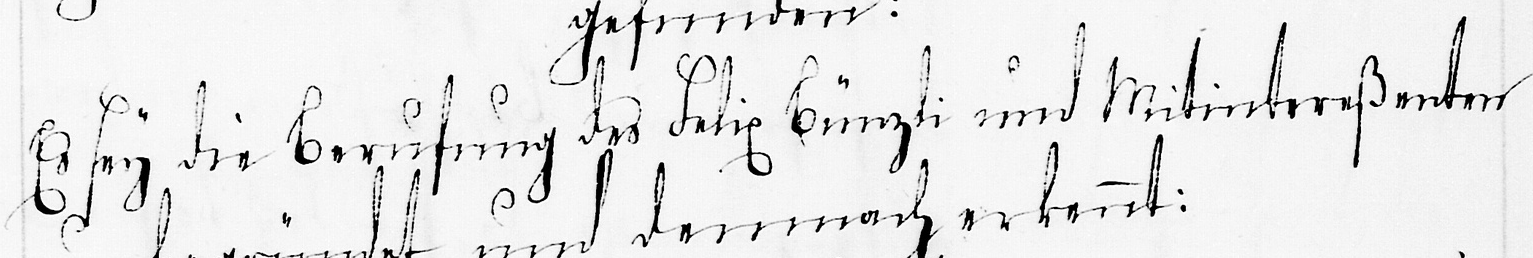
Es sey die Berufung des Felix Bünzli und Mitintereßenten
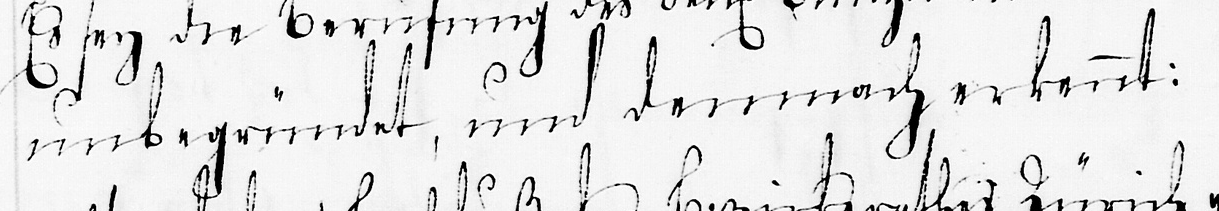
unbegründet, und demnach erkennt:
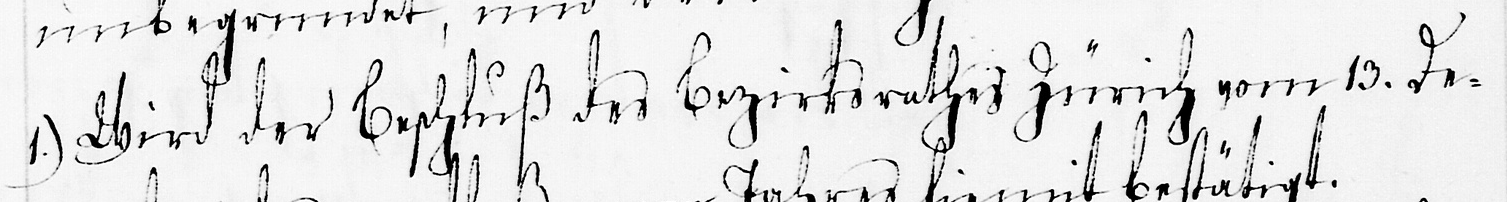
1.) Wird der Beschluß des Bezirksrathes Zürich vom 13. De¬
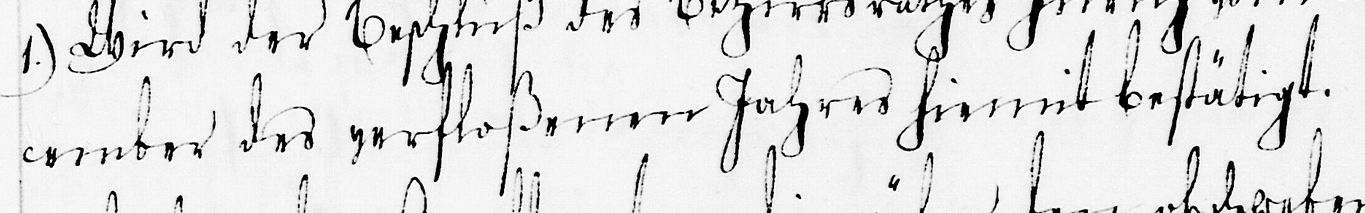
cember des verfloßenen Jahres hiemit bestätigt.
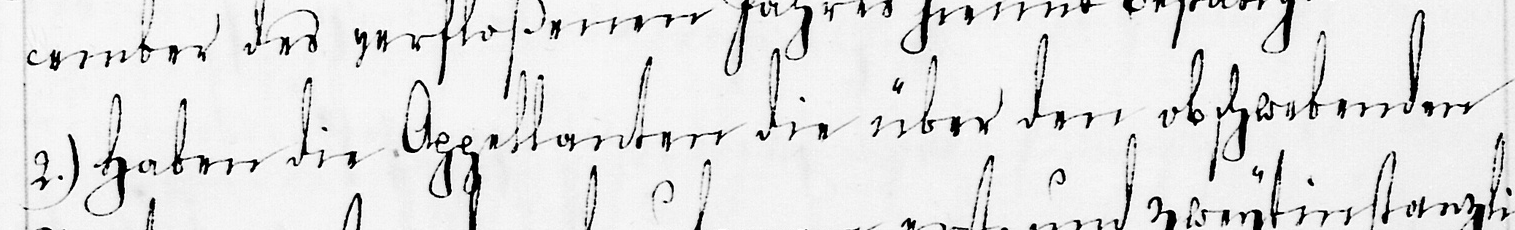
2.) Haben die Appellanten die über den obschwebenden
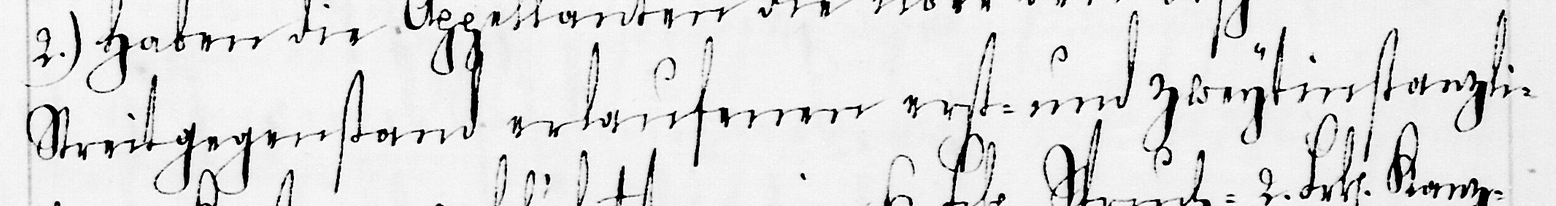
Streitgegenstand erlaufenen erst- und zweytinstanzli¬
